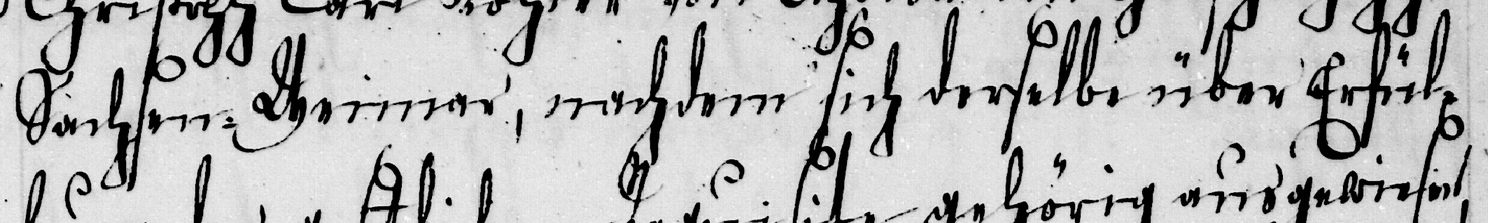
Sachsen-Weimar, nachdem sich derselbe über Erfül¬
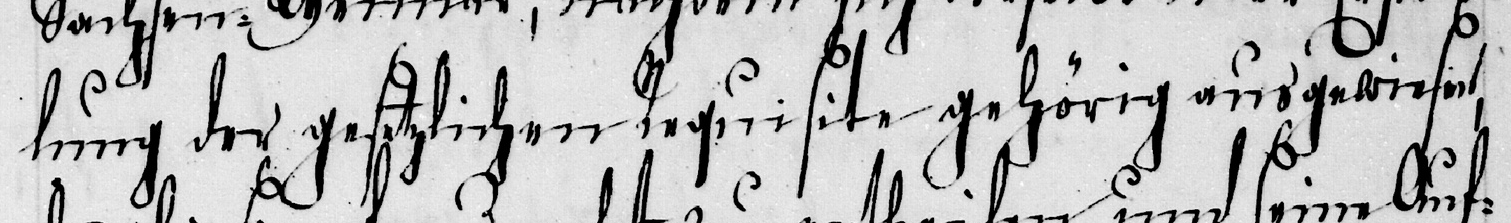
lung der gesetzlichen Inquisite gehörig ausgewiese¬
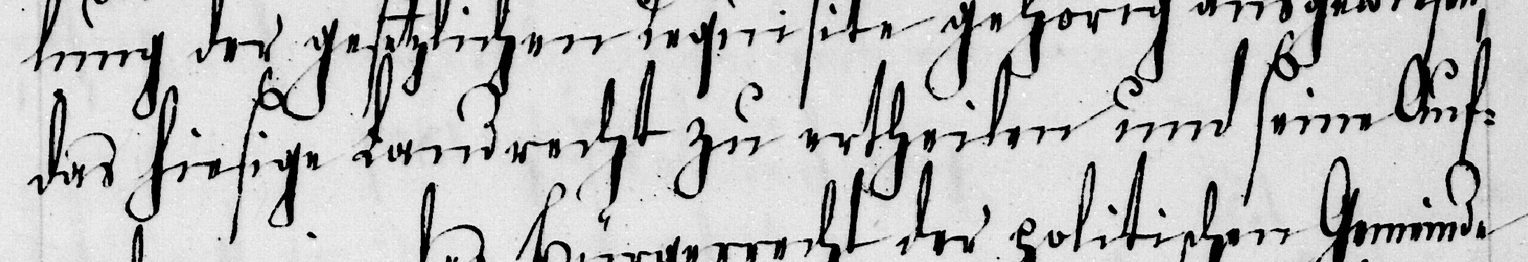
das hiesige Landrecht zu ertheilen und seine Auf¬
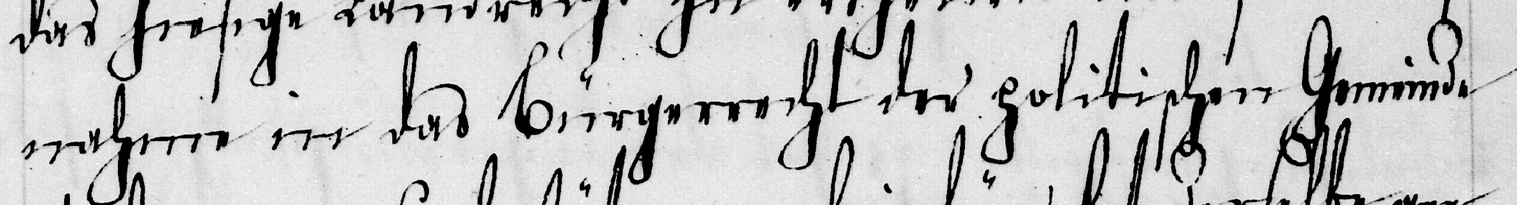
nahme in das Bürgerrecht der politischen Gemeinde
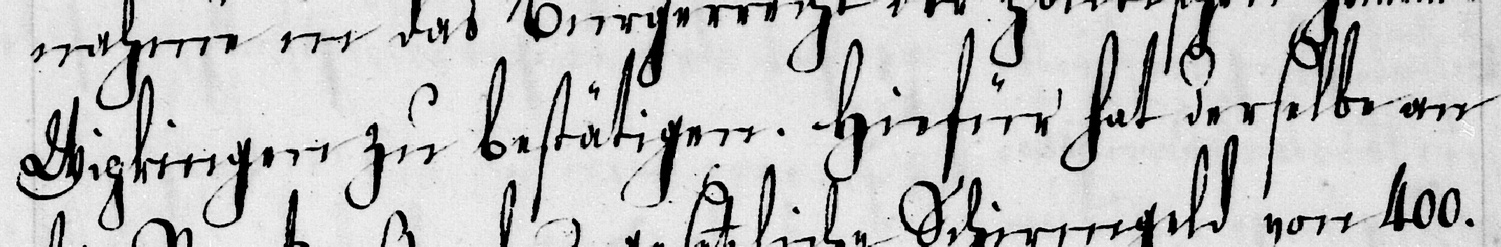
Wipkingen zu bestätigen. Hiefür hat derselbe an
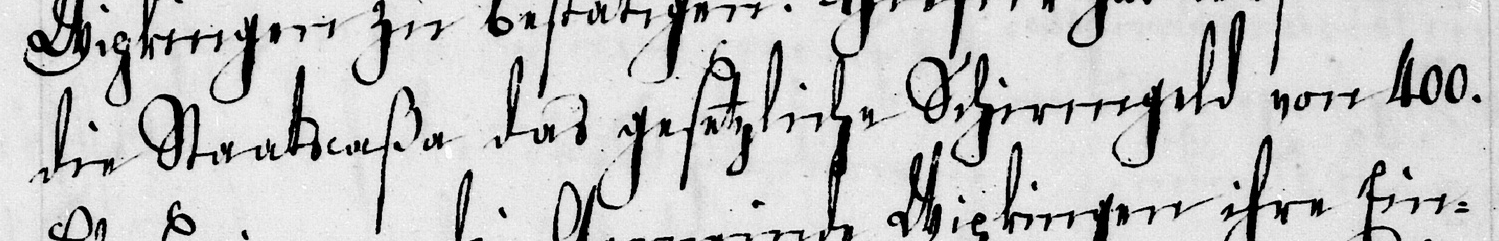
die Staatscaßa das gesetzliche Schirmgeld von 400.
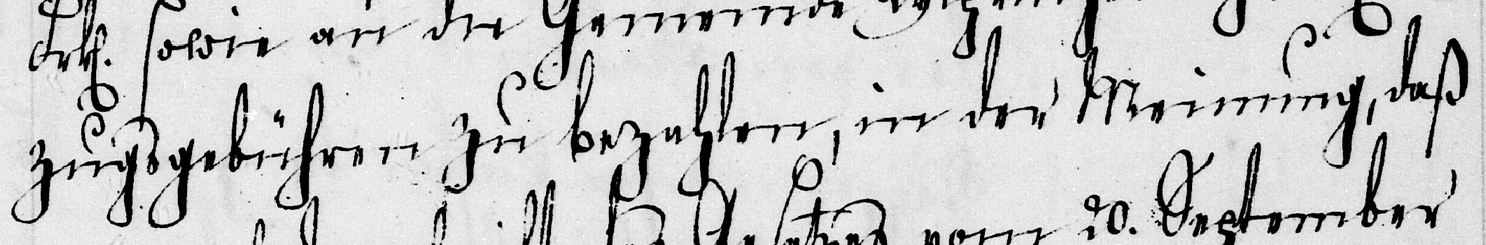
zugsgebühren zu bezahlen, in der Meinung, daß
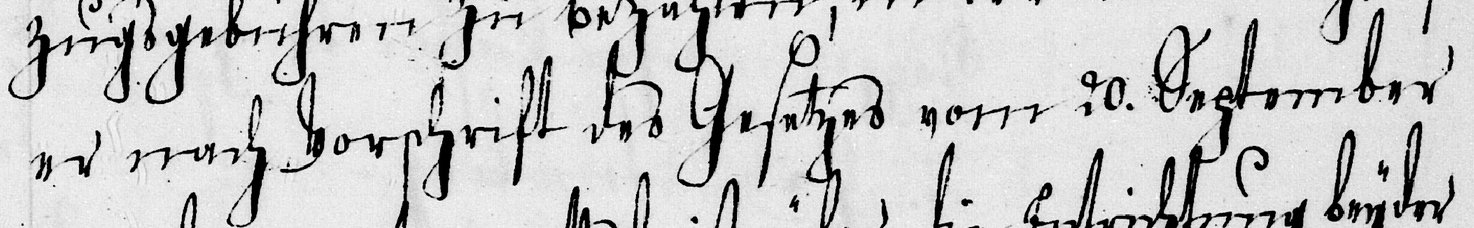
er nach Vorschrift des Gesetzes vom 20. September
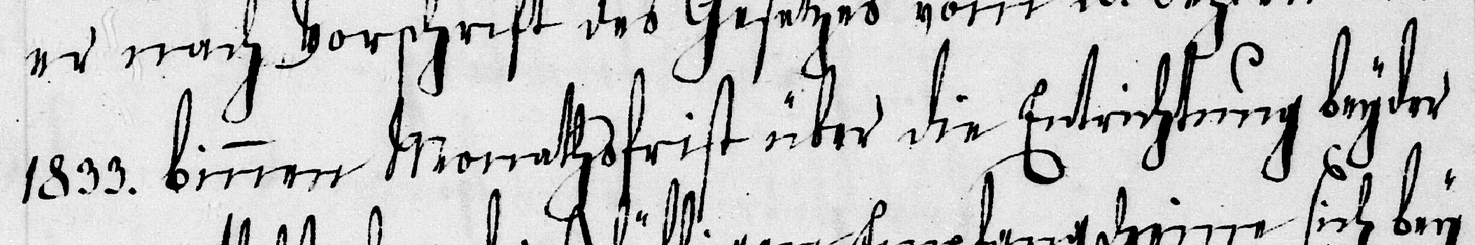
1833. binnen Monathsfrist über die Entrichtung beyder
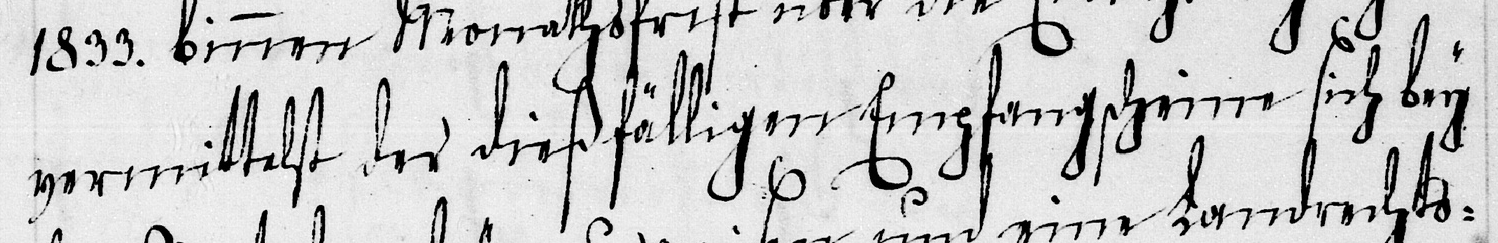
vermittelst der dießfälligen Empfangscheine sich bey
